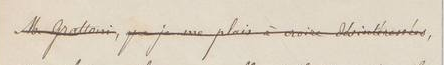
Mr. Grattoni, que je me plais à croire désintéressées,
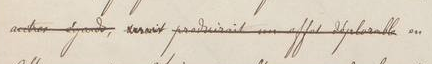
autres égards, serait produirait un effet déplorable en
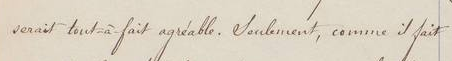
serait tout-à-fait agréable. Seulement, comme il fait
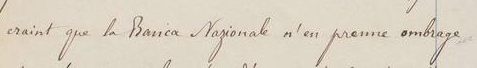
craint que la Banca Nazionale n'en prenne ombrage
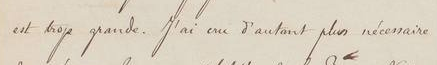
est trop grande. J'ai cru d'autant plus nécessaire
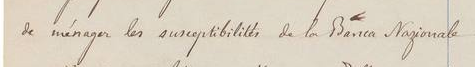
de ménager les susceptibilités de la Banca Nazionale
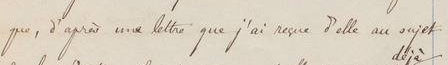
que, d'après une lettre que j'ai reçue d'elle au sujet
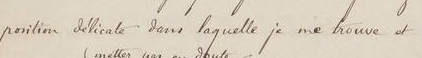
position délicate dans laquelle je me trouve et
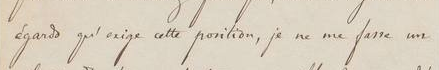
égards qu'exige cette position, je ne me fasse un
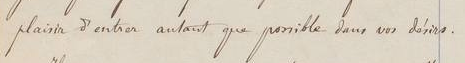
plaisir d'entrer autant que possible dans vos désirs.
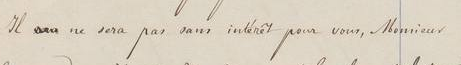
Il sera ne sera pas sans intérêt pour vous, Monsieur
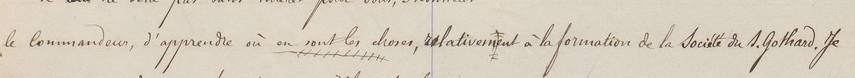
le Commandeur, d'apprendre où en sont les choses, relativement à la formation de la Société du S. Gothard. Je
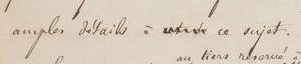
amples détails à ... ce sujet.
